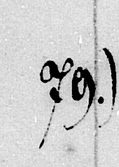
79.)
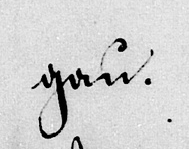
gau.
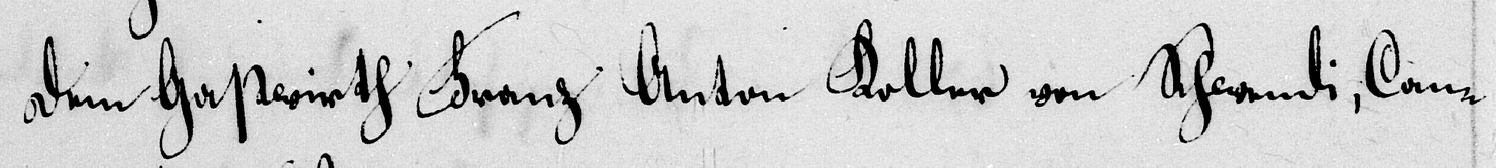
Dem Gastwirth Franz Anton Koller von Schwendi, Ca¬
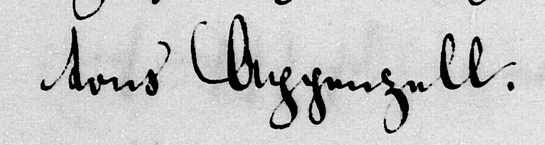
ntons Appenzell.
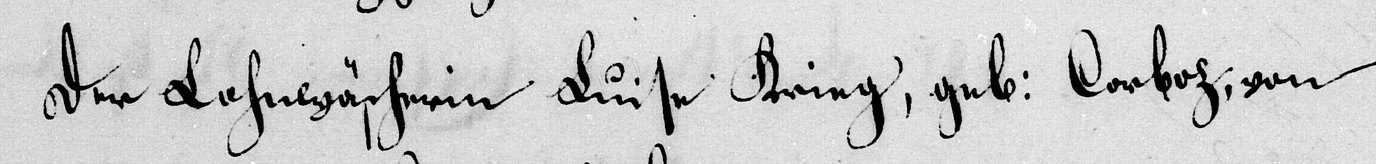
Der Lohnwäscherin Luise Krieg, geb: Corboz, von
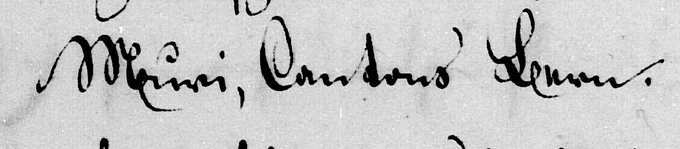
Muri, Cantons Bern.
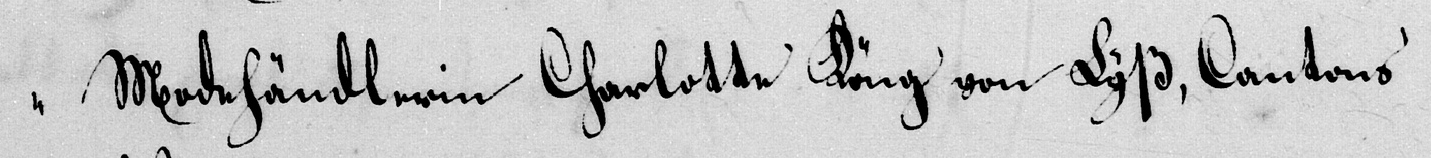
“ Modehändlerin Charlotte Köng von Lyß, Cantons
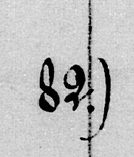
82.)
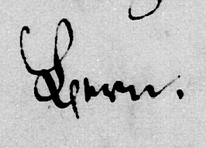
Bern.
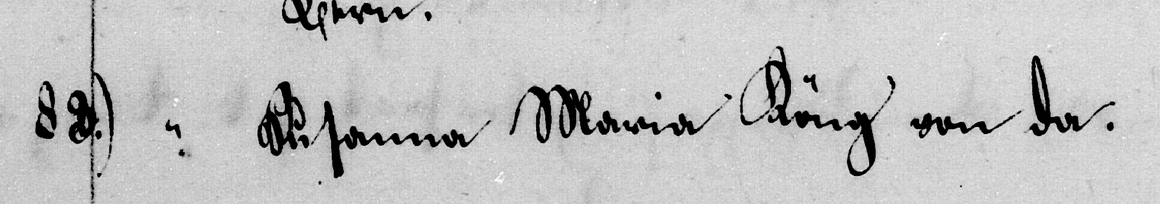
83.) “ Susanna Maria Köng von da.
